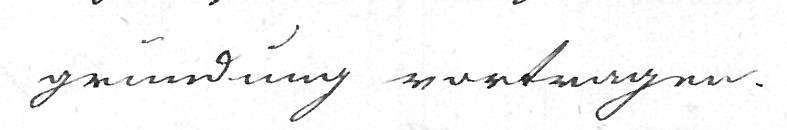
gründung vortragen.
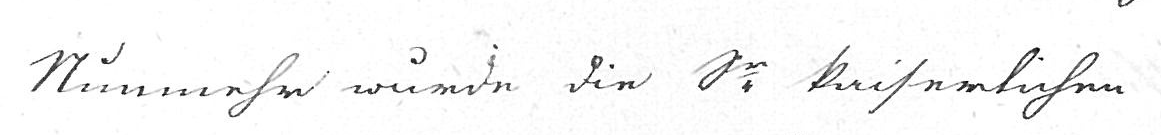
Nunmehr wurde die Sr. kaiserlichen
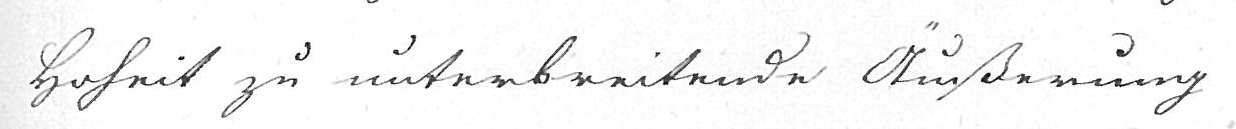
Hoheit zuunterbreitende Äußerung
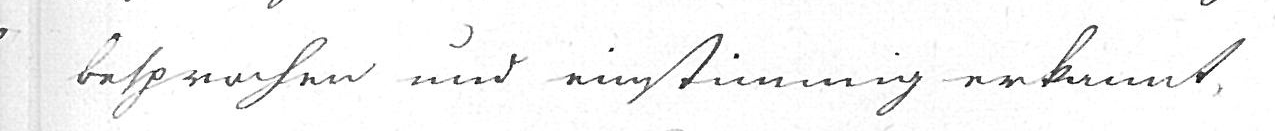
besprochen und einstimmig erkannt,
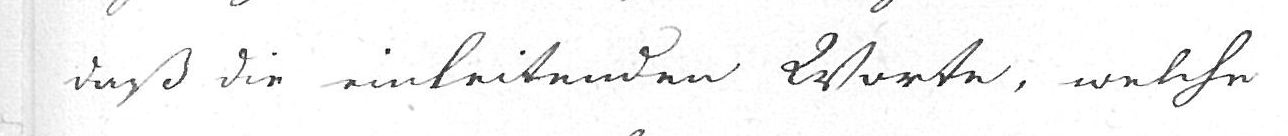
daß die einleitenden Worte, welche
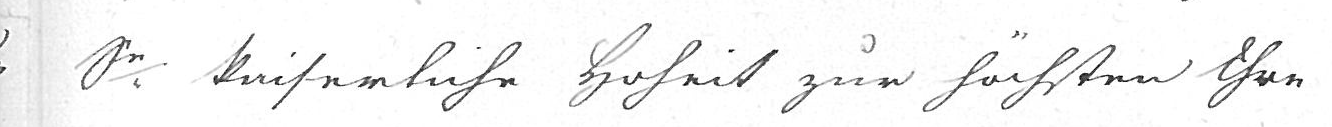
Sr. kaiserliche Hoheit zur höchsten Ehre
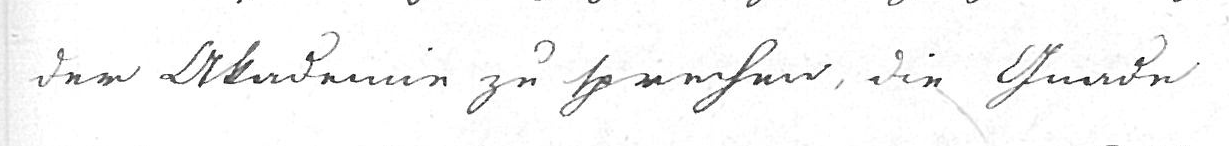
der Akademie zu sprechen die Gnade
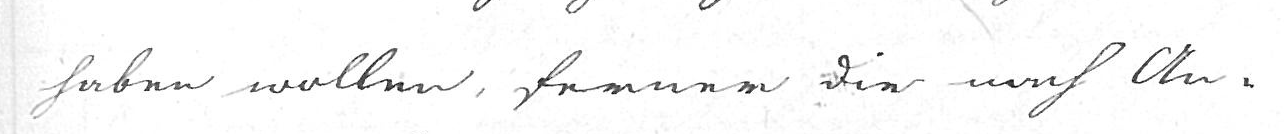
haben wollen, ferner die nach An-
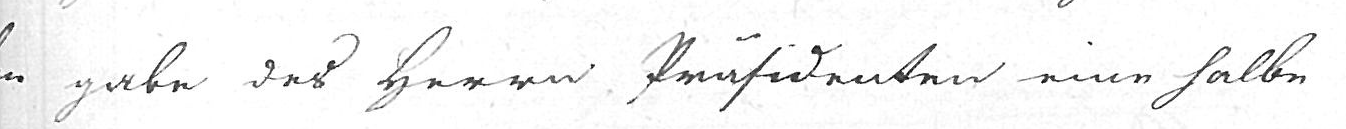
gabe des Herrn Präsidenten eine halbe
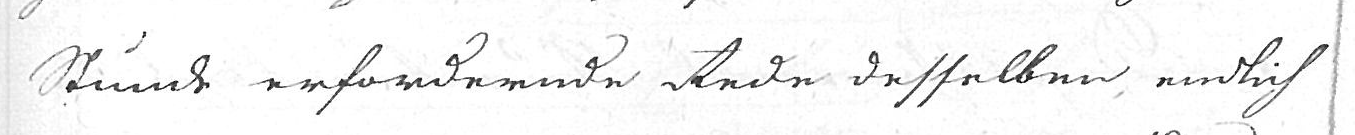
Stunde erfordernde Rede desselben, endlich
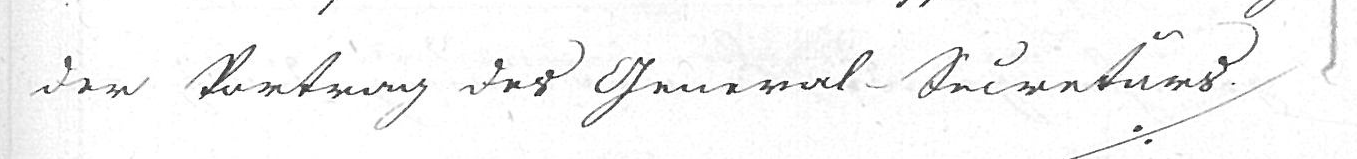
der Vortrag des General-Secretärs
